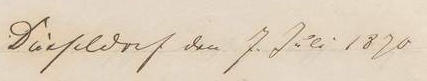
Düsseldorf den 7. Juli 1870
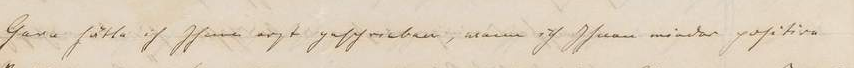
Gern hätte ich Ihnen erst geschrieben, wenn ich Ihnen wieder positive
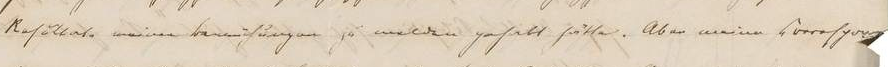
Resultate meiner Bemühungen zu melden gehabt hätte. Aber meine Correspon-
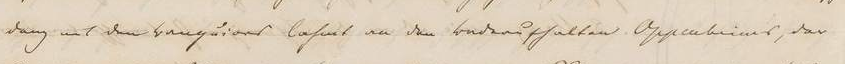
denz mit den Banquiers lahmt an den Badeaufthalten Oppenheim's, der
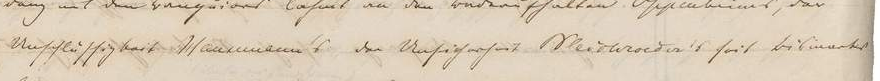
Unschlüssigkeit Hansemann's der Unsicherheit Bleichroeder's seit Bismarks
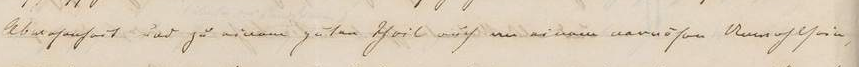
Abwesenheit und zu einem guten Theil auch an einem nervösen Unwohlsein,
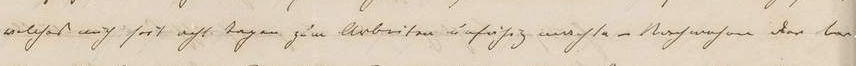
welches mich seit acht Tagen zum Arbeiten unfähig machte – Nachwehen der Ber-
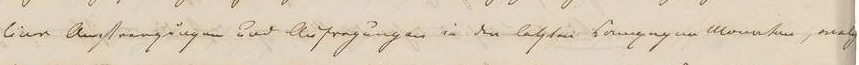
liner Anstrengungen und Aufregungen in den letzten Campagne Monaten, welche
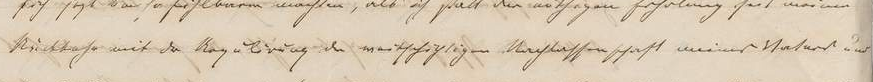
Rückkehr mit der Regulirung der weitschichtigen Nachlassenschaft meines Vaters und
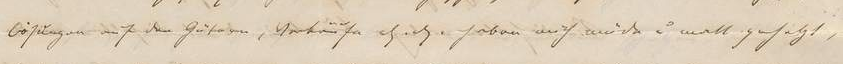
lösungen auf den Gütern, Verkäufe etc. etc. haben mich müde u matt gesetzt,
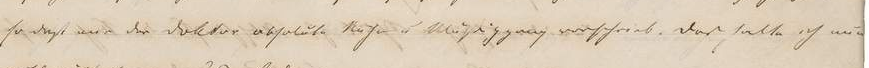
so daß mir der Doktor absolute Ruhe und Müßiggang verschrieb. Das halte ich nun
